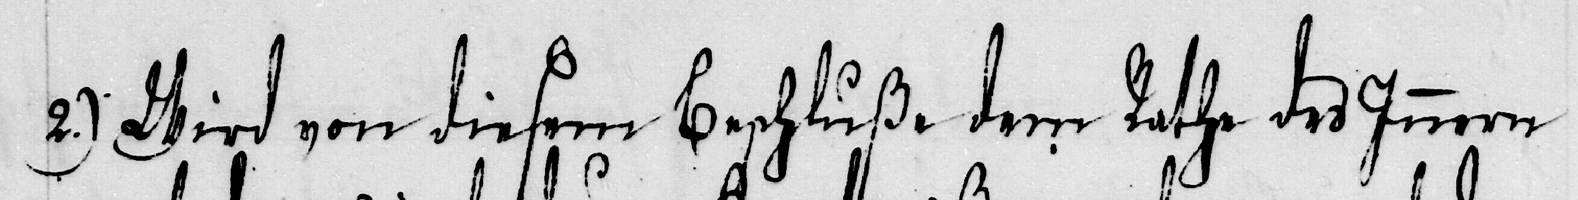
2.) Wird von diesem Beschluß dem Rathe des Innern
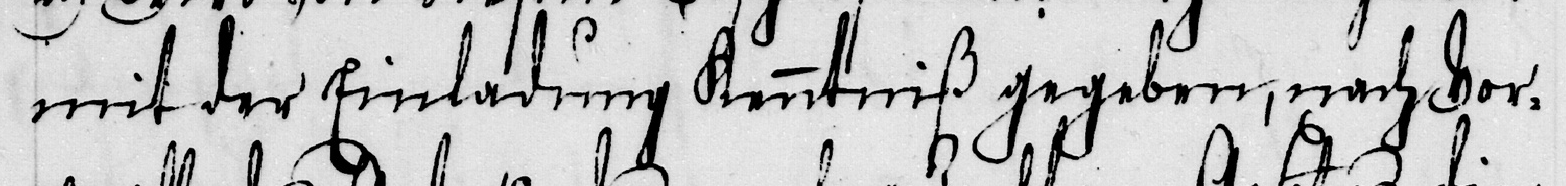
mit der Einladung Kenntniß gegeben, nach Vor¬
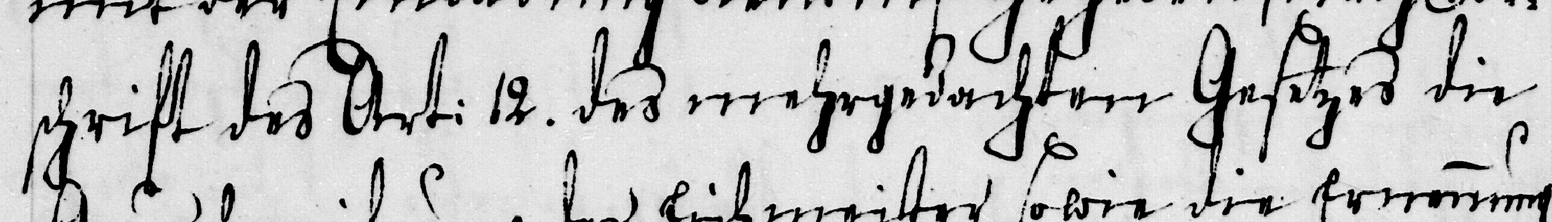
schrift des Art. 12. des mehrgedachten Gesetzes die
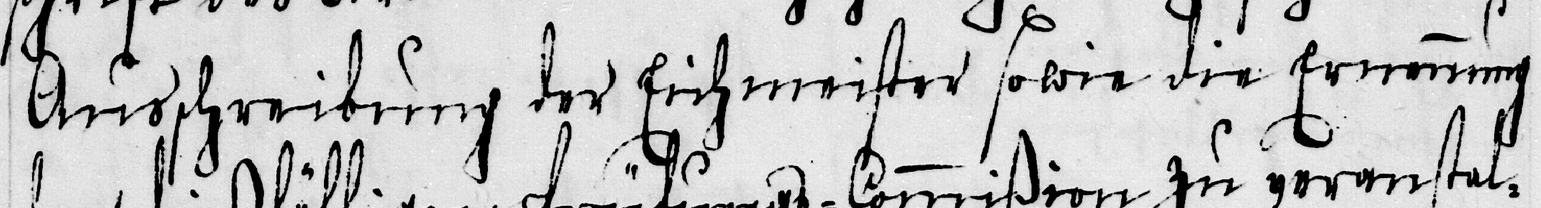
Ausschreibung der Eichmeister sowie die Ernennung
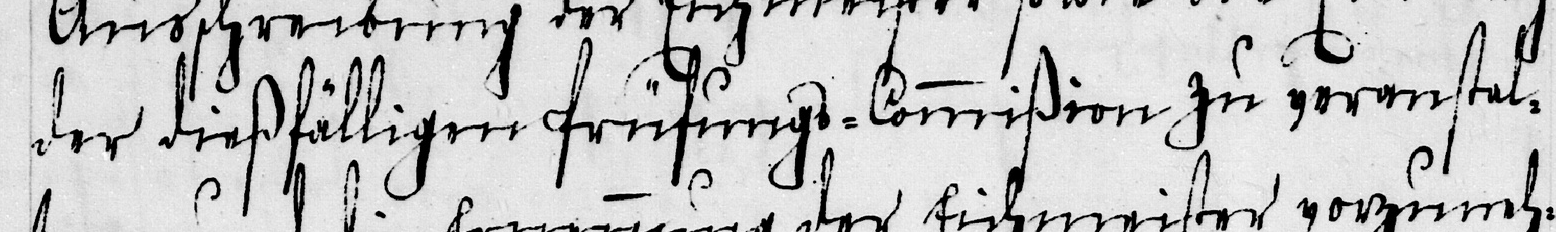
der dießfälligen Prüfungs-Commißion zu veranstal¬
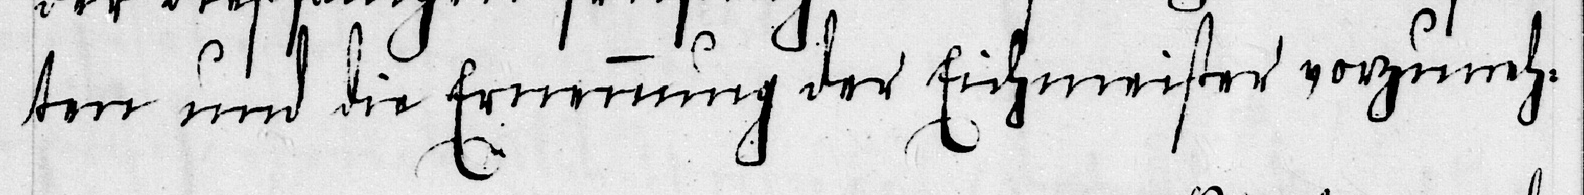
ten und die Ernennung der Eichmeister vorzuneh¬
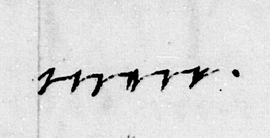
men.
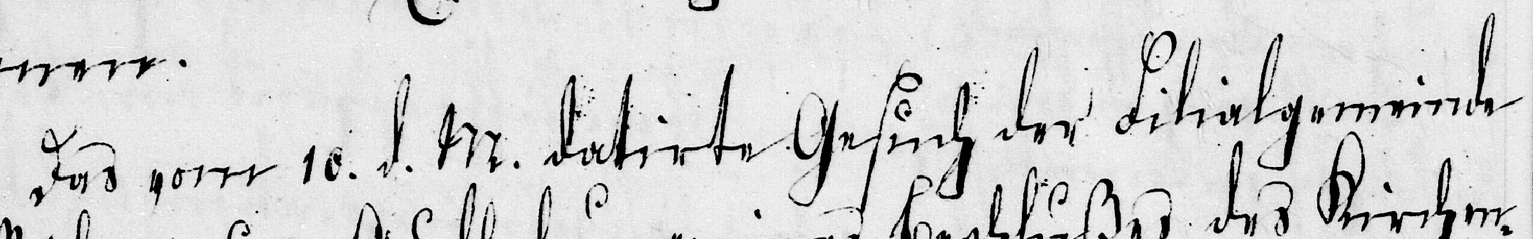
Das vom 10. d. M. datirte Gesuch der Filialgemeinde
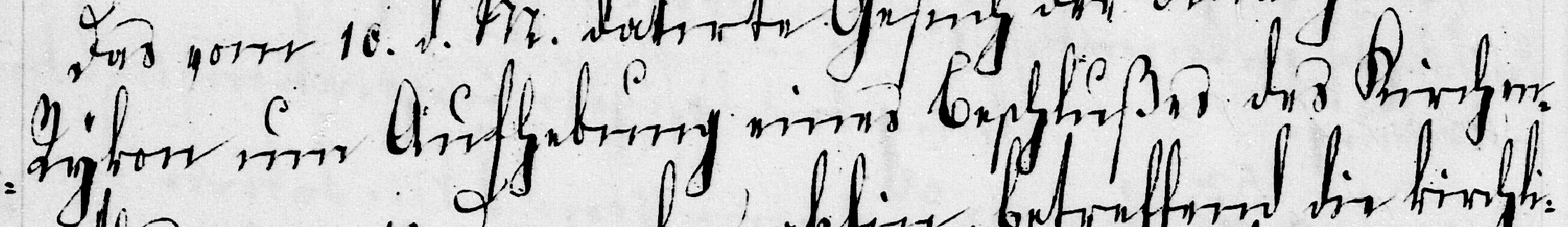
Rykon um Aufhebung eines Beschlußes des Kirchen¬
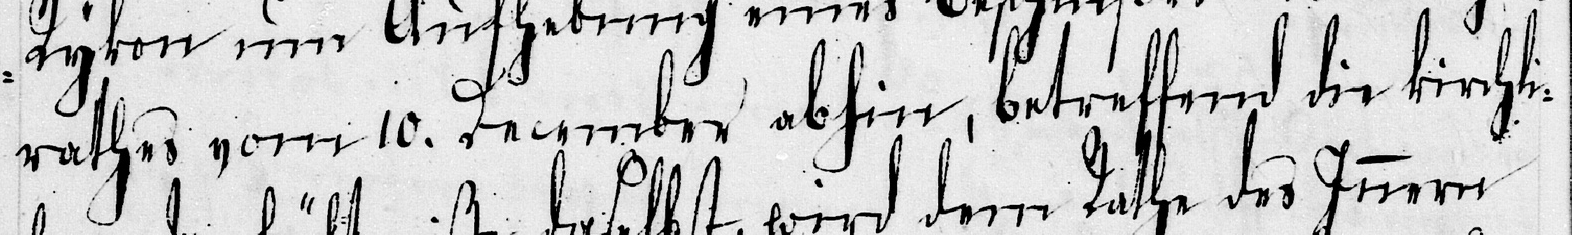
rathes vom 10. December abhin, betreffend die kirchl¬
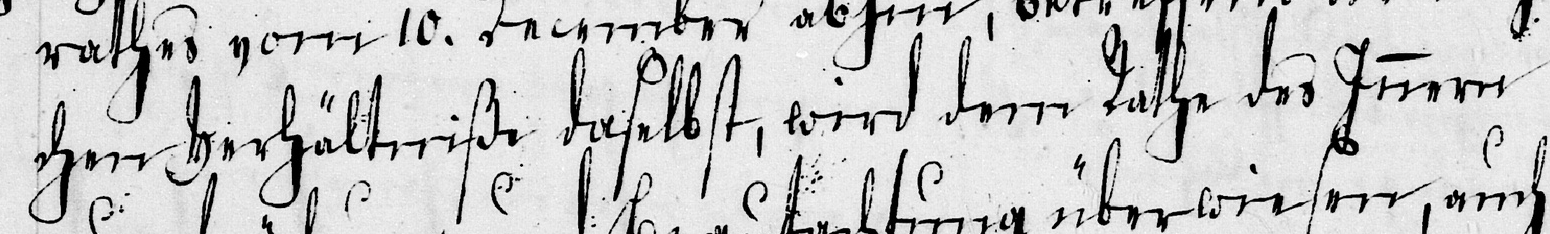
ichen Verhältniße daselbst, wird dem Rathe des Innern
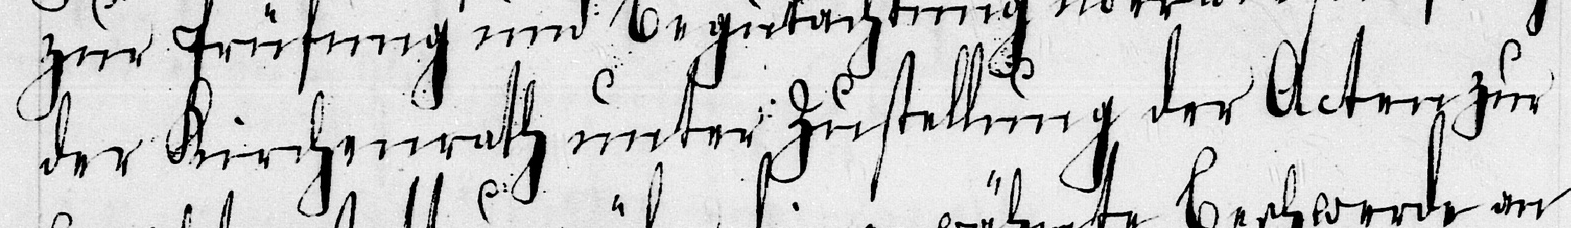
der Kirchenrath unter Zustellung der Acten zur
